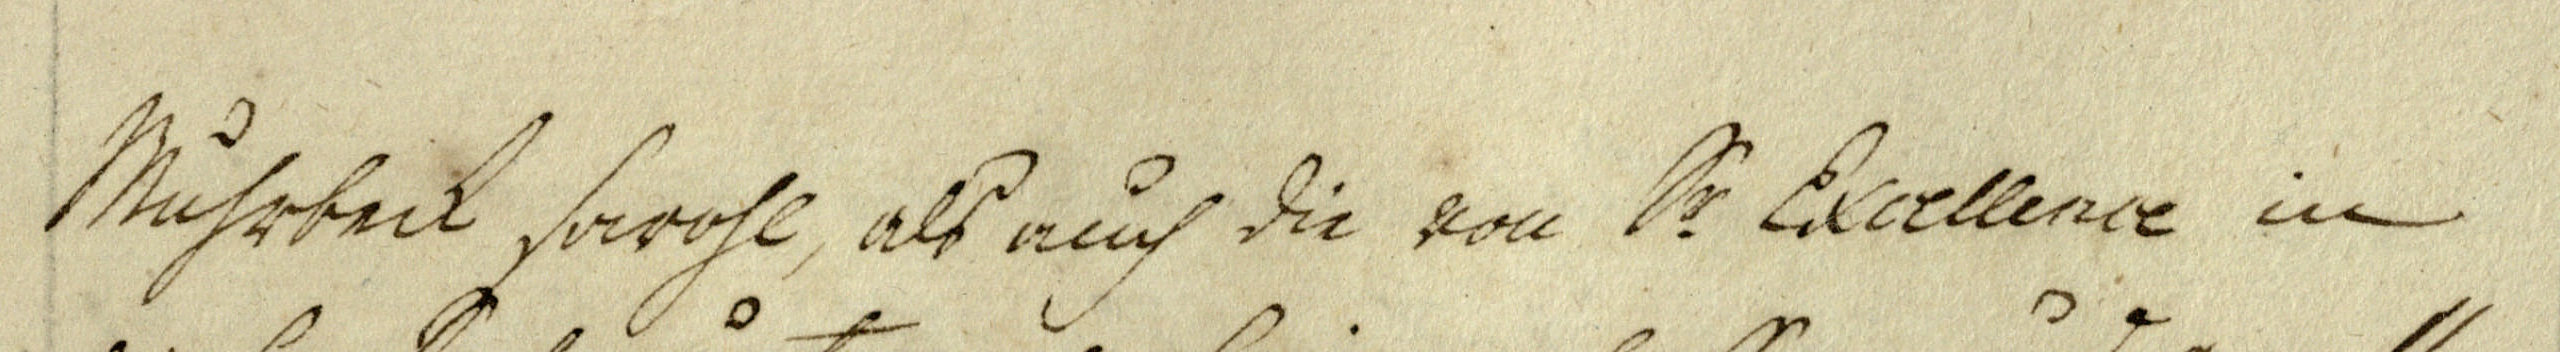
Muhrbeck sowohl, als auch die von Sr Excellence in
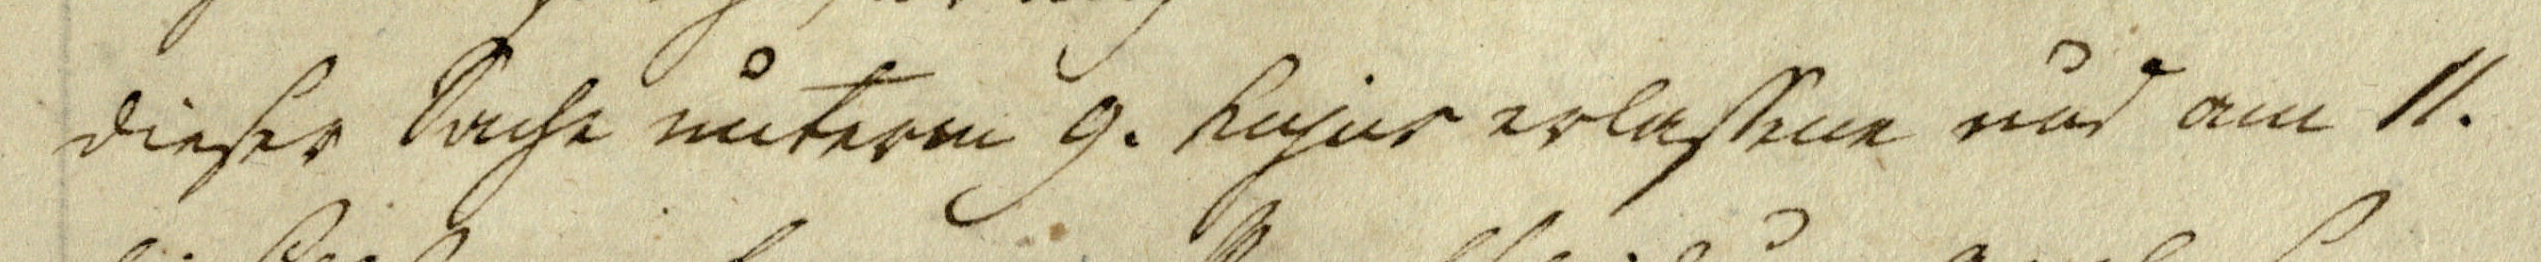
dieser Sache unterm 9. hujus erlassene und am 11.
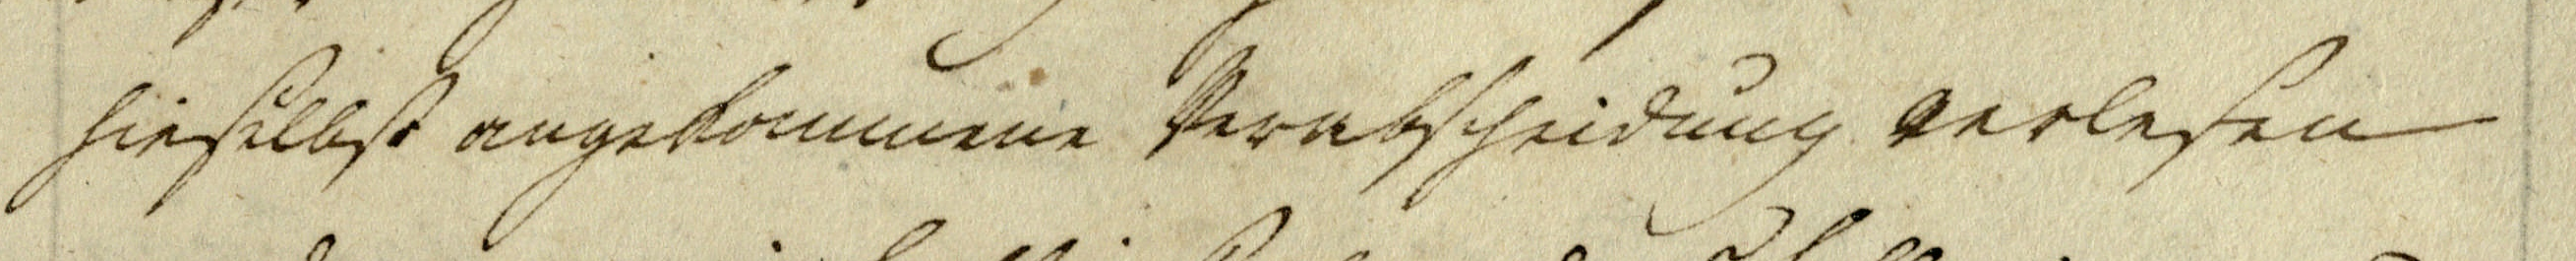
hieselbst angekommene Verabscheidung verlesen
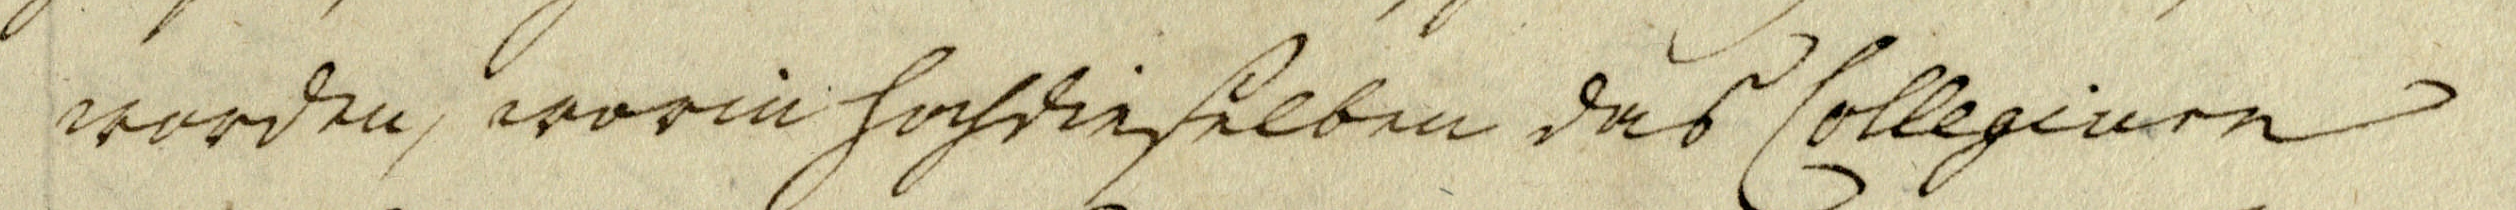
worden, worin hochdieselben das Collegium
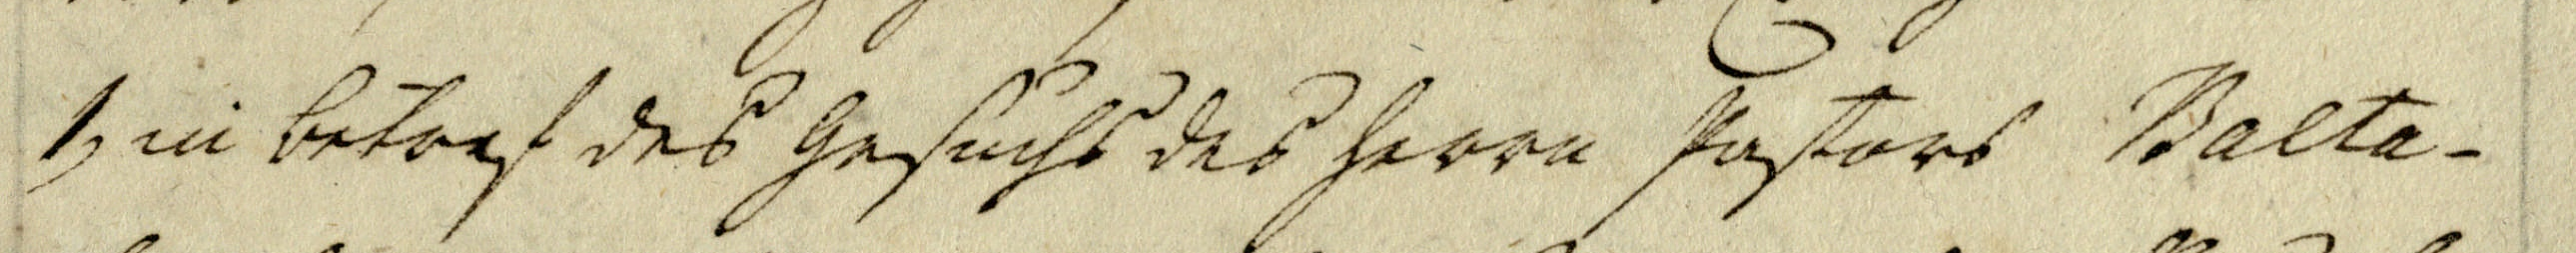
1. in betref des Gesuchs des Herrn Pastors Balta¬
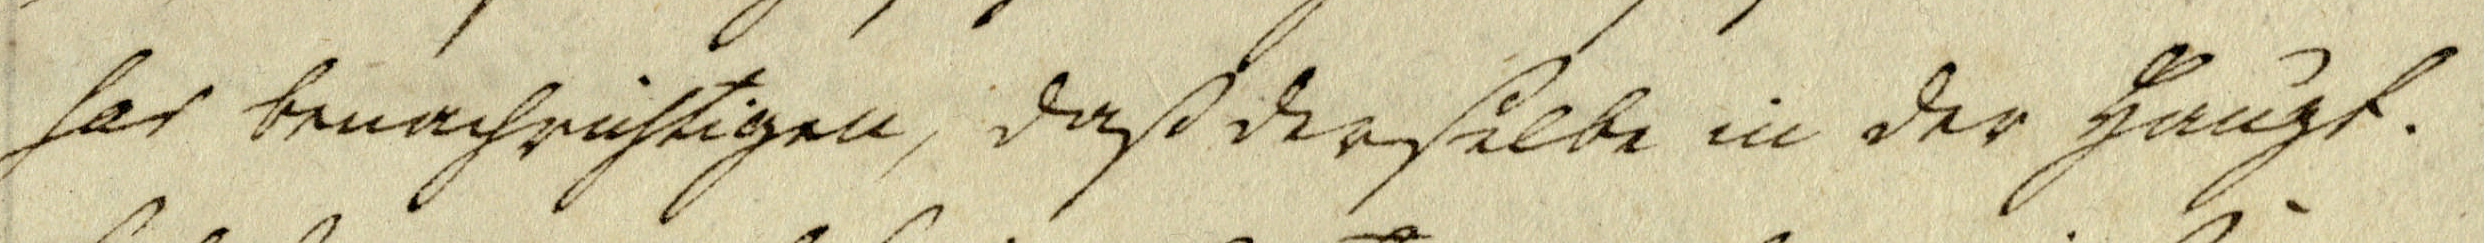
sar benachrichtigen, daß derselbe in der Haupt¬
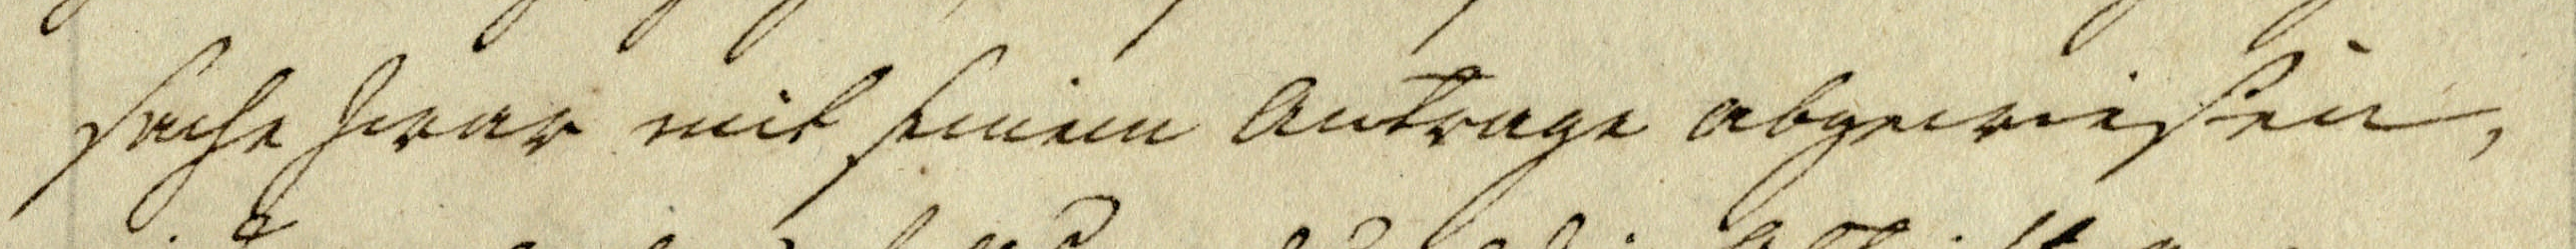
sache zwar mit seinem Antrage abgewiesen,
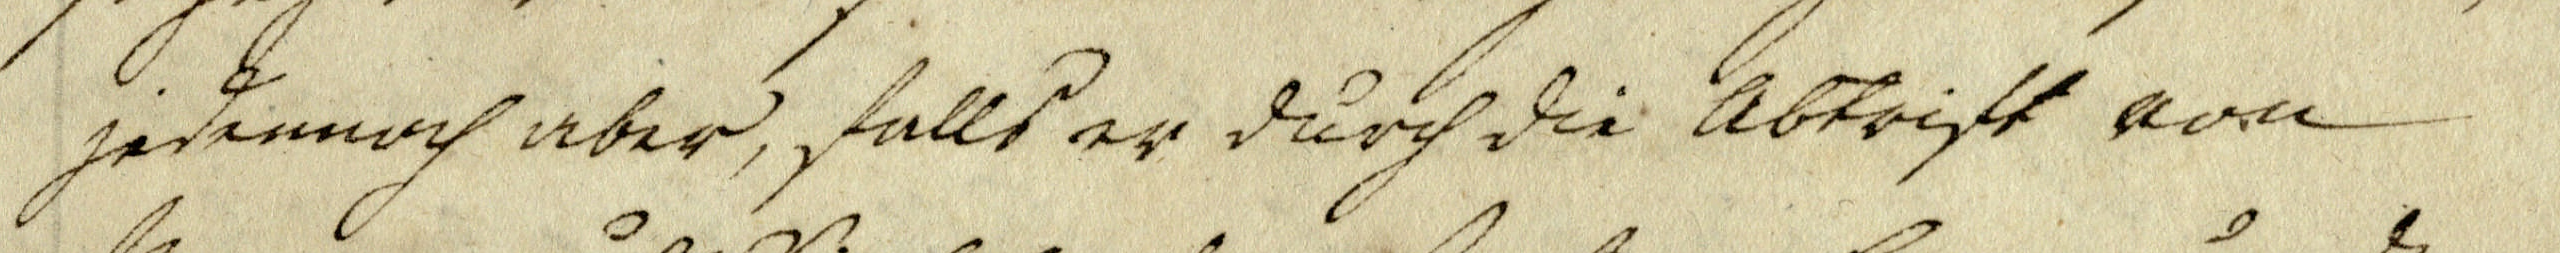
jedennoch aber, falls er durch die Abtrift von
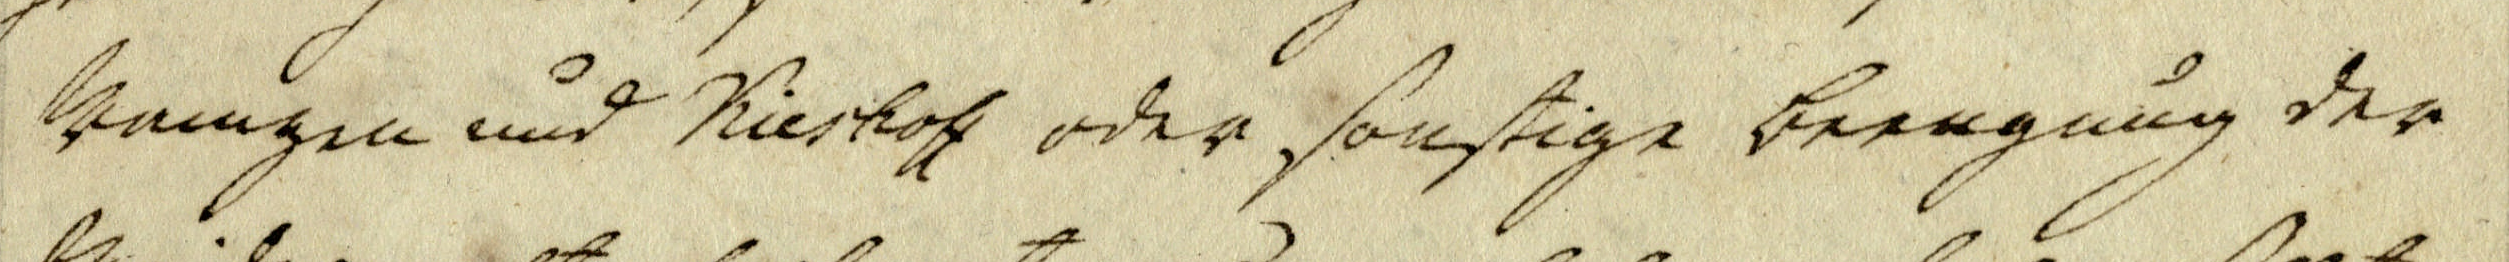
Wampen und Kieshoff oder sonstige Beengung der
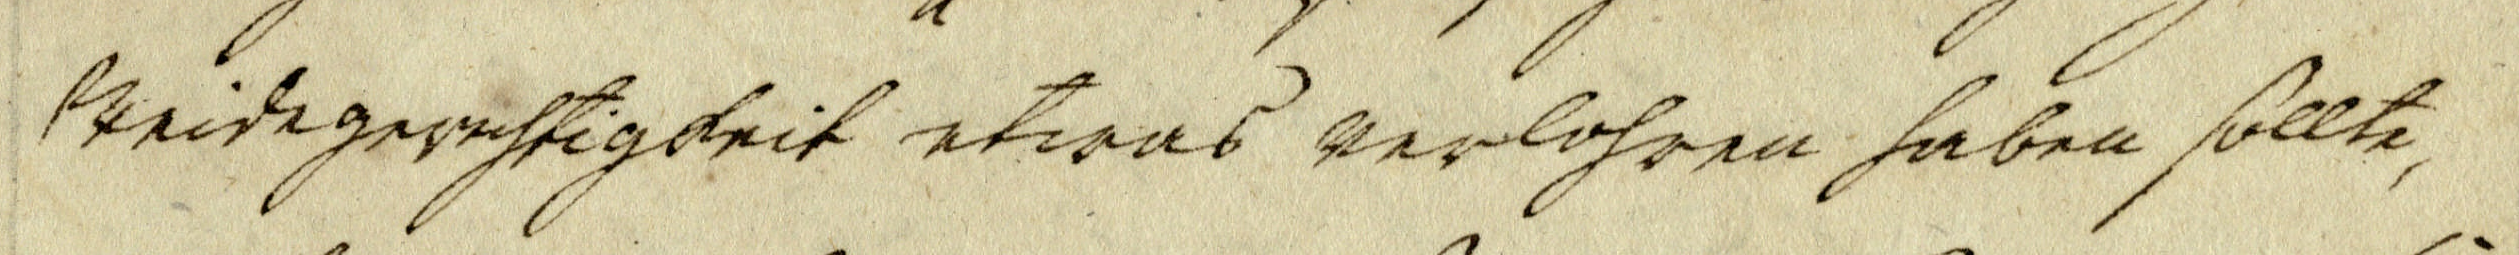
Weidegerechtigkeit etwas verlohren haben sollte,
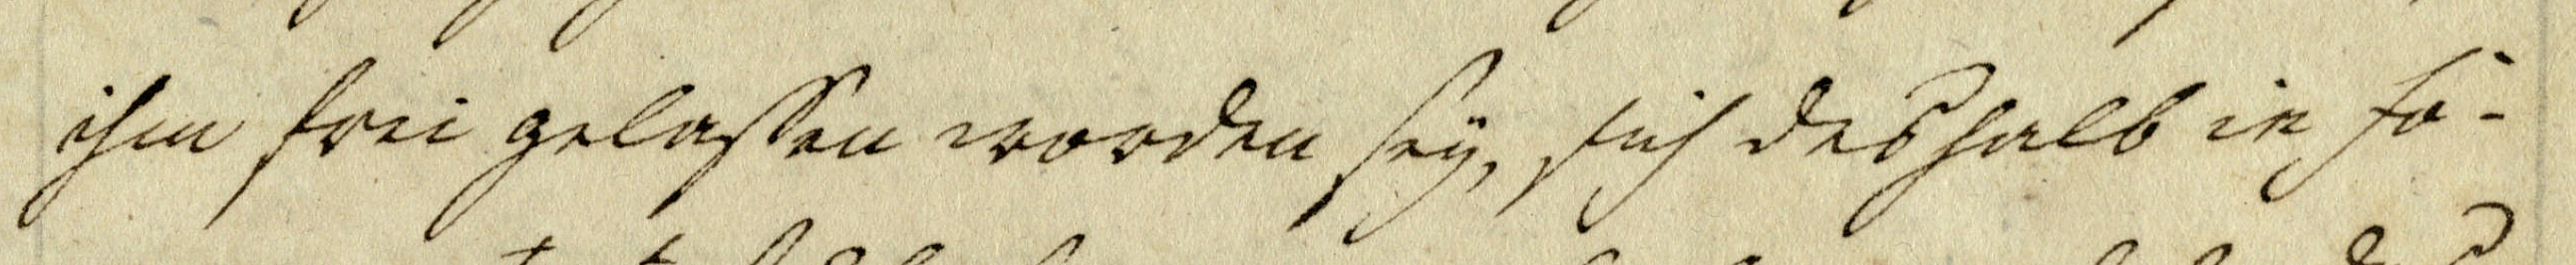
ihm frei gelassen worden seÿ, sich deshalb in Fo¬
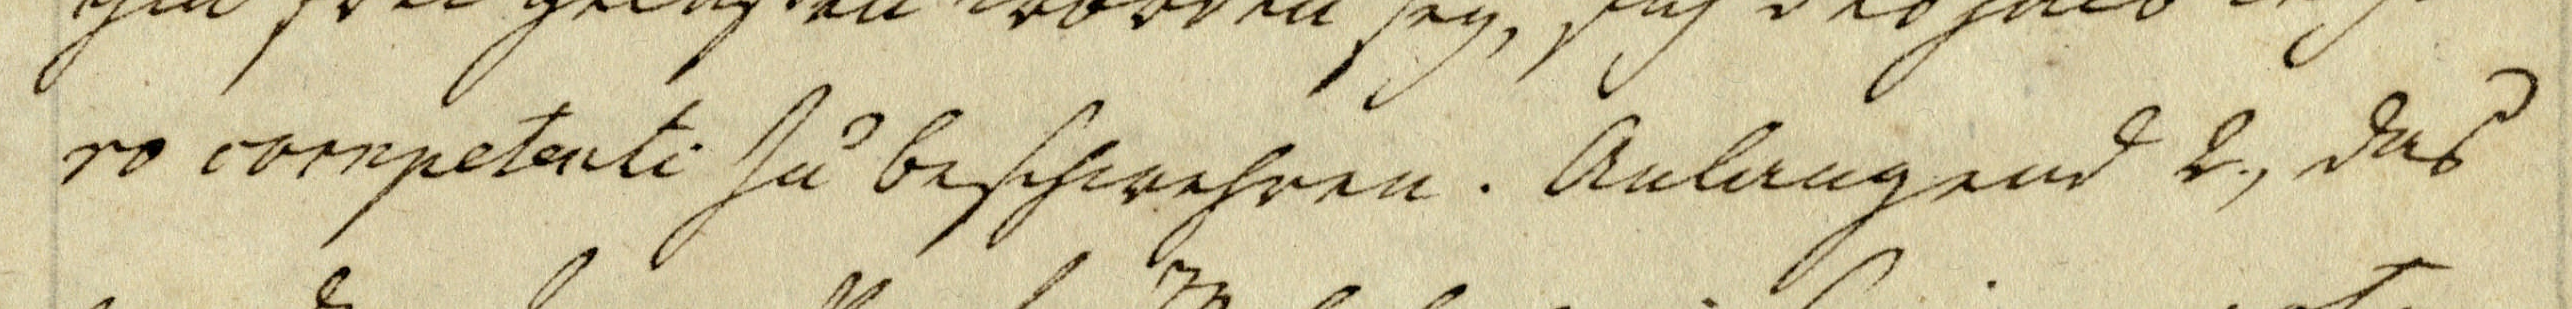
so competenti zu beschwehren. Anlangend 2., das
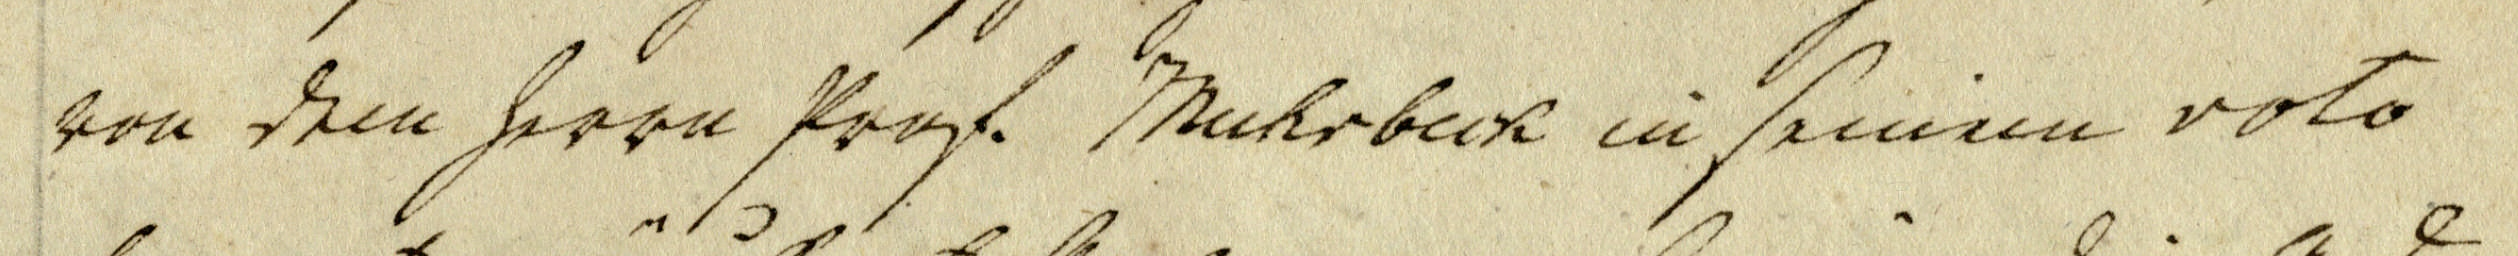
von dem Herrn Prof. Muhrbeck in seinem voto
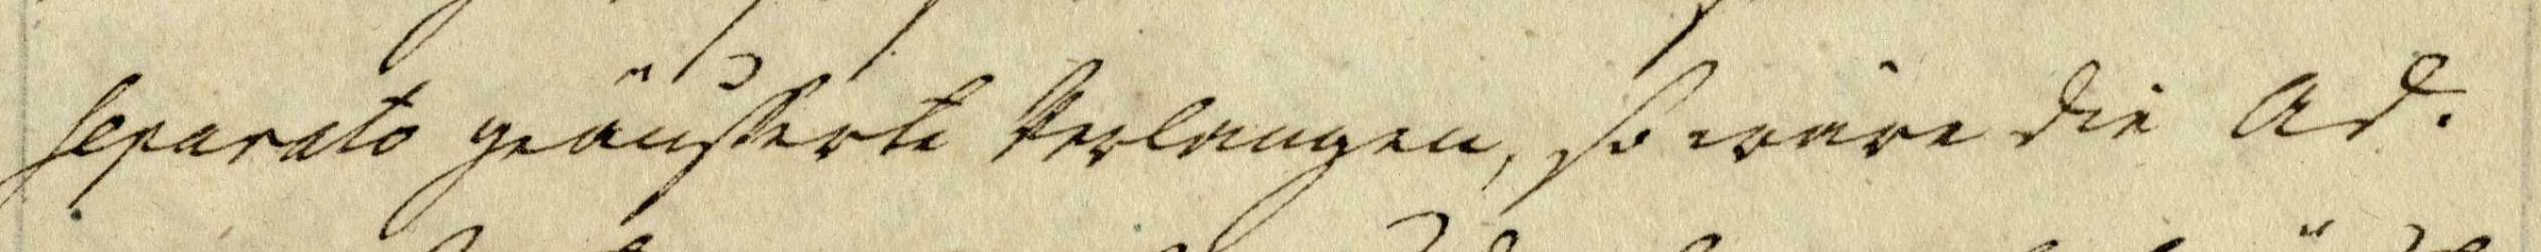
separato geäusserte Verlangen, so wäre die Ad¬
